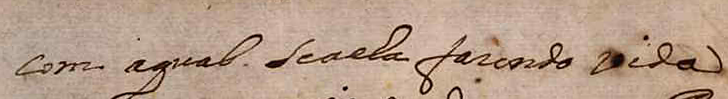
com a qual se acha fazendo vida
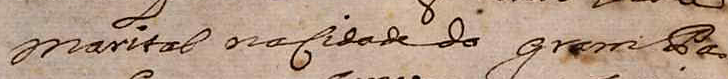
marital na Cidade do gram Pa
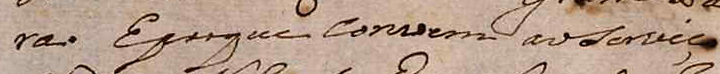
ra. E porque convem ao serviço
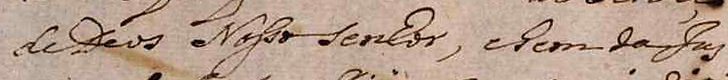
de Deos Nosso senhor, e bem da Jus
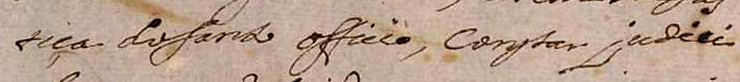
tiça do santo officio, constar judici
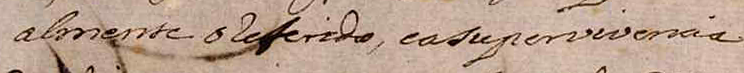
almente o Referido, e a supervivencia
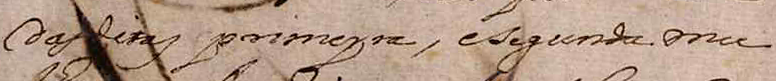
das ditas primeyras e segunda mu
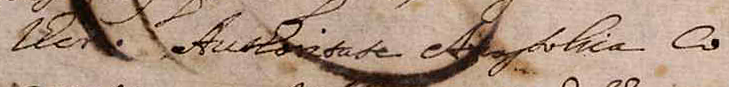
lher Authoritate A_ostolica co
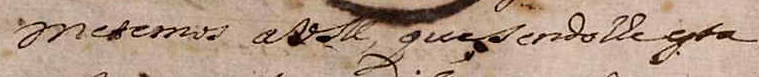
metemos a VM, que sendolhe esta
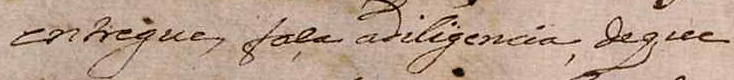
entregue, faça a diligencia, de que
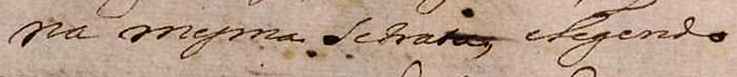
na mesma se trata, elegendo
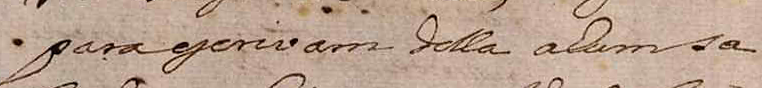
para escrivam della a hum sa
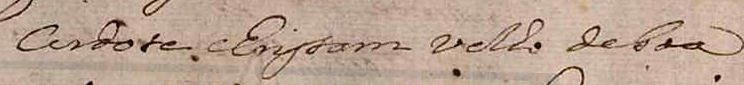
cerdote christam velho de boa
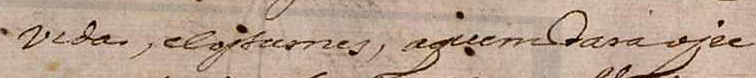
vida, e costumes, a quem dara o ju
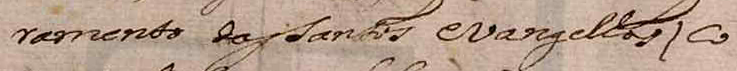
ramento dos Santos evangelhos, co
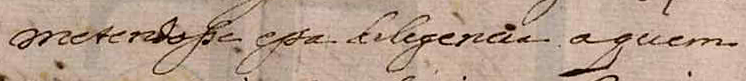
metendosse esta deligencia a quem
